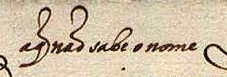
a q̄ naõ sabe o nome
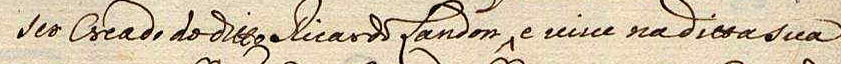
seo Creado do ditto Ricardo Landon, e uiue na ditta sua
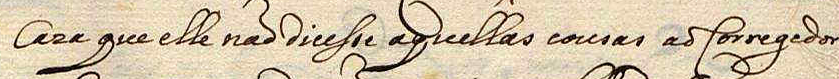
Caza que elle naõ dicesse aquellas cousas ao Corregedor
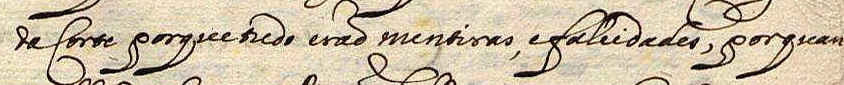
da Corte porque tudo eraõ mentiras, e falcidades, porquan
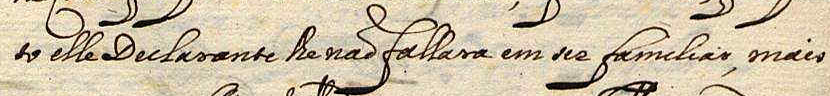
to elle Declarante lhe não fallara em ser familiar, mais
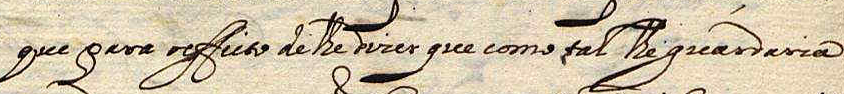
que para o effeito de lhe dizer que como tal lhe guardaria
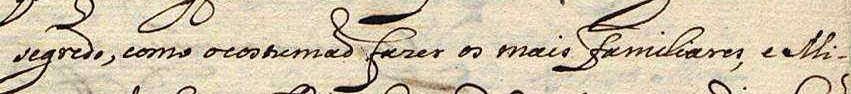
segredo, como o costumaõ fazer os mais familiares, e Mi
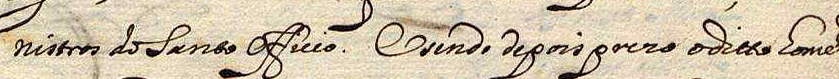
nistros do Santo officio. E sendo depois prezo o ditto homē
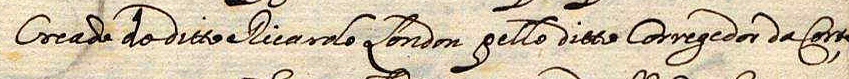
Creado do ditto Ricardo London pello ditto Corregedor da Corte,
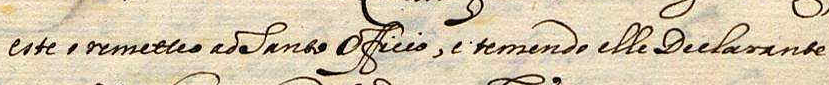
este o remetteo ao Santo Officio, e temendo elle Declarante
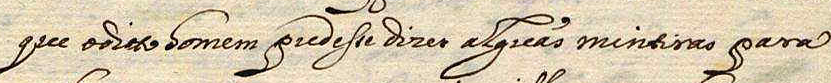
que o ditto homem pudesse dizer alguās mintiras para
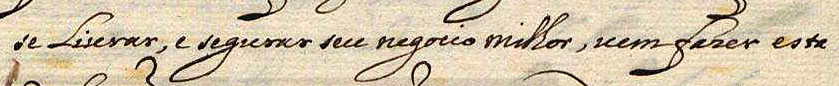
se Liurar, e segurar seu negocio milhor, uem fazer esta
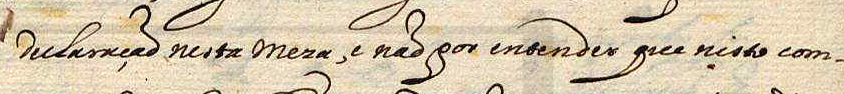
declaraçaõ nesta meza, e naõ por entender que nisto com
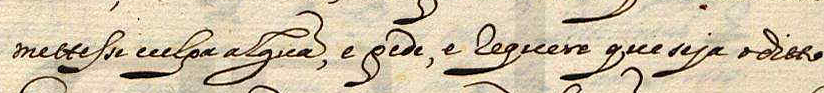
mettesse culpa alguā, e pede, e Requere que seja o ditto
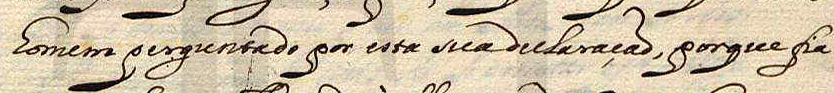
homem perguntado por esta sua declaraçaõ, porque fia
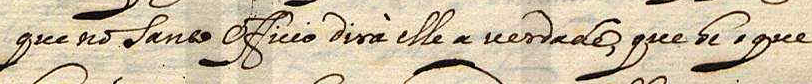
que no Santo Officio dirà elle a uerdade, que he o que
